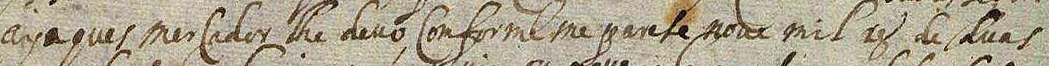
a yaques merCador lhe deuo Comforme me parese noue mil rs̄ de duas
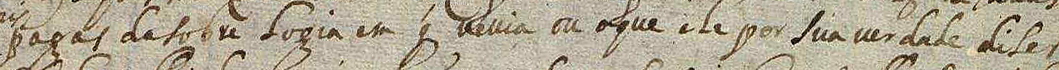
pagas da sobreLogia em q̄ ueuia ou o que eLe por sua uerdade diser
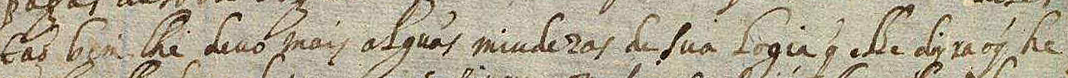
taõ bem lhe deuo mais aLguās miudezas de sua Logia q̄ eLLe deyxa o q̄ he
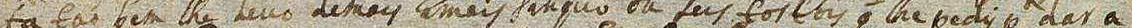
taõ bem lhe deuo demais a mais sinquo ou seis tostois q̄ lhe pedy pa dar a
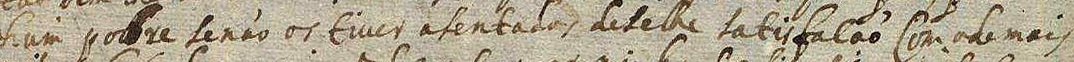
hum pobre se não os tiuer asentados deselhe satisfaCaõ Com o demais
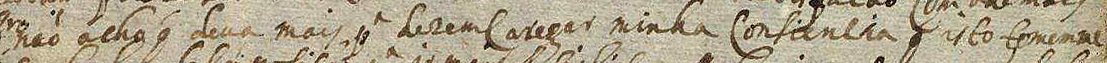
naõ acho q̄ deua mais pa dezemCaregar minha Consiencia q̄ isto tomemme
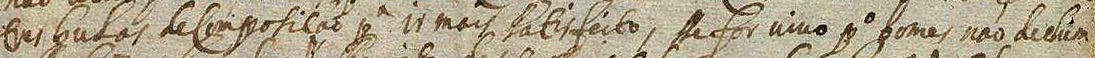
tres buLas de ComposiÇaõ pa ir mais satisfeito, sse for uiuo po gomes naõ dechem
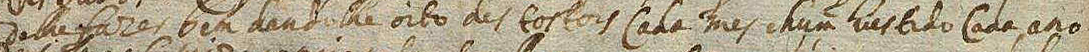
de lhe fazer bem dandolhe oito des tostois Cada mes e hum uestido cada ano
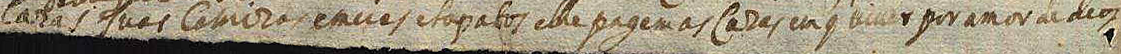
suas camizas e meias e sapatos e lhe pagem as Cazas em q̄ uiuer por amor de deos
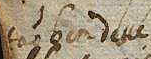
taõ bem deue
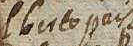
_Lberto pais
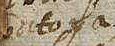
__to _a
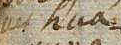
ues hua
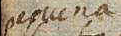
pequena
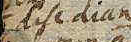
dise dian
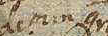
te de min q̄
